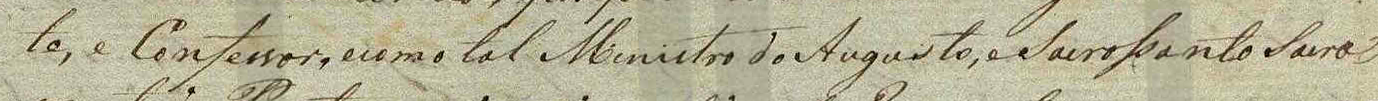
te, e Confessor, e como tal Ministro do Augusto, e Sacrossanto Sacra
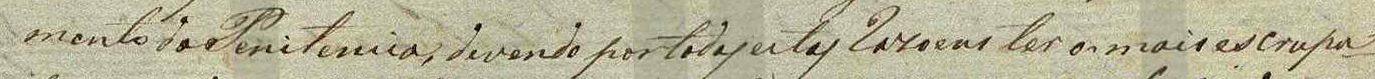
mento da Penitencia, devendo por todas estas Razoens ter os mais escrupo
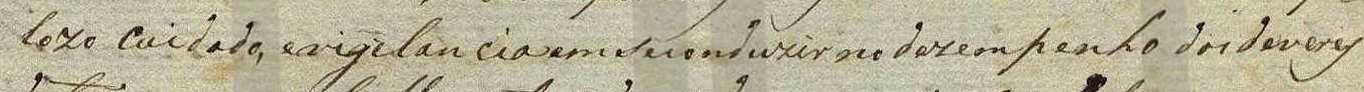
lozo cuidado, e vigilancia em se conduzir no dezempenho dos deveres
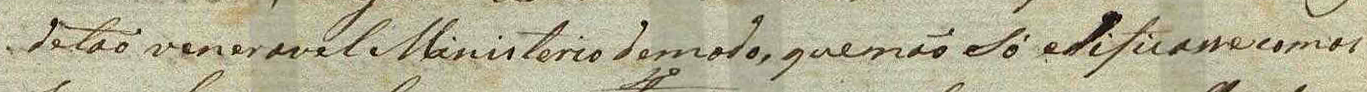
de taõ veneravel Ministerio de modo, que naõ só edificasse com as
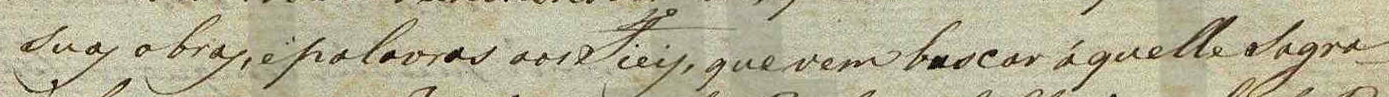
suas obras, e palavras aos Fieis, que vem buscar áquelle Sagra
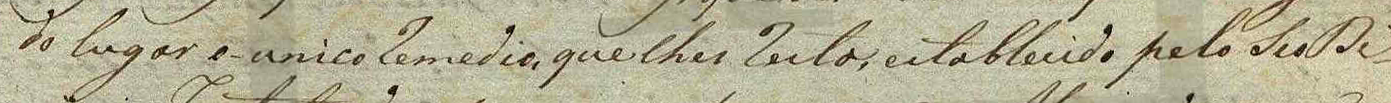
do lugar o unico Remedio, que lhes Resta, establecido pelo Seo Di
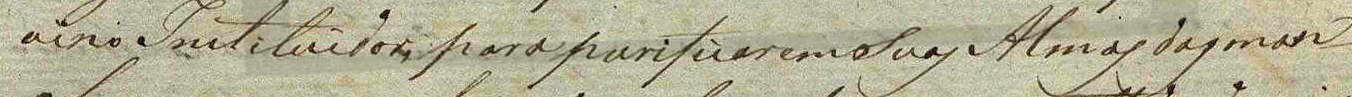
vino Instituidor, para purificarem suas Almas das man
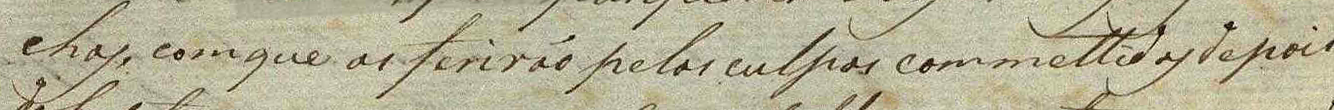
chas, com que as feriraõ pelas culpas commettidas depois
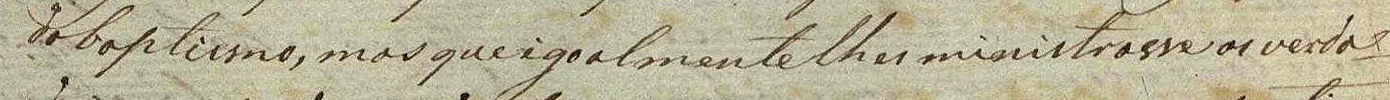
do baptismo, mas que igoalmente lhes ministrasse as verda
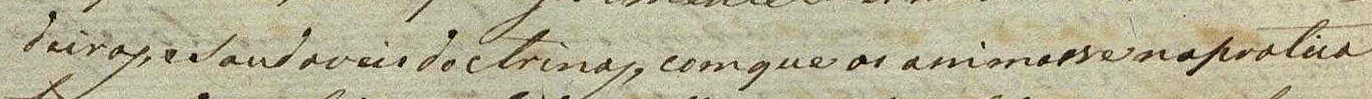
deiras, e saudaveis doctrinas, com que as animasse na pratica
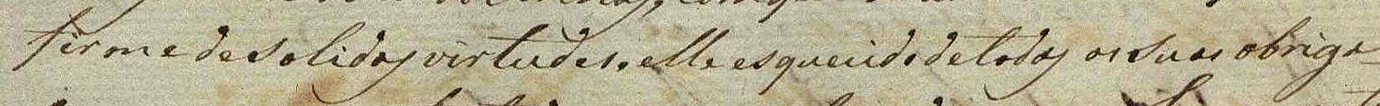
firme de solidas virtudes, elle esquecido de todas as suas obriga
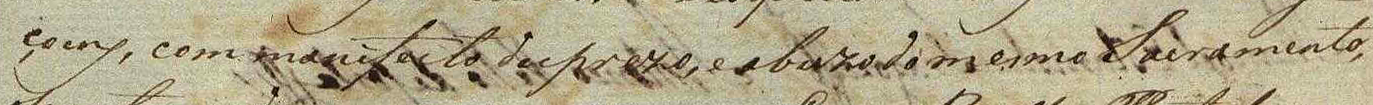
çoens, com manifesto deprezo, e abuzo do mesmo Sacramento,
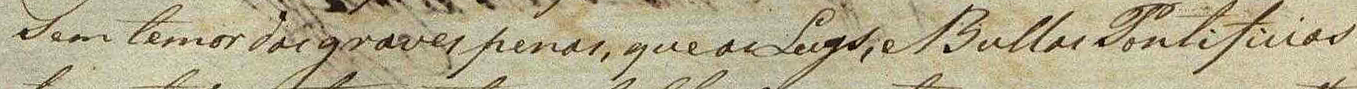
sem temor das graves penas, que as Leys, e Bullas Pontificias
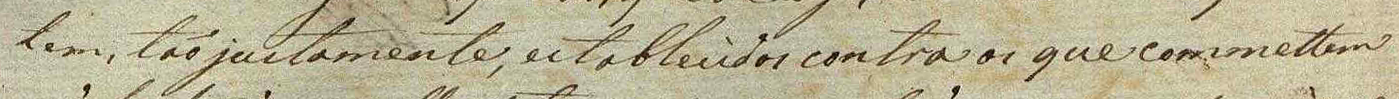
tem, taõ justamente, establecidas contra os que commettem
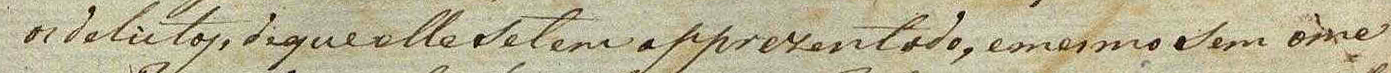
os delictos, de que elle se tem apprezentado, e mesmo sem o me
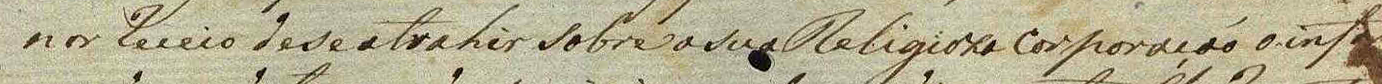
nor Receio de se atrahir sobre a sua Religioza corporaçaõ o infa
